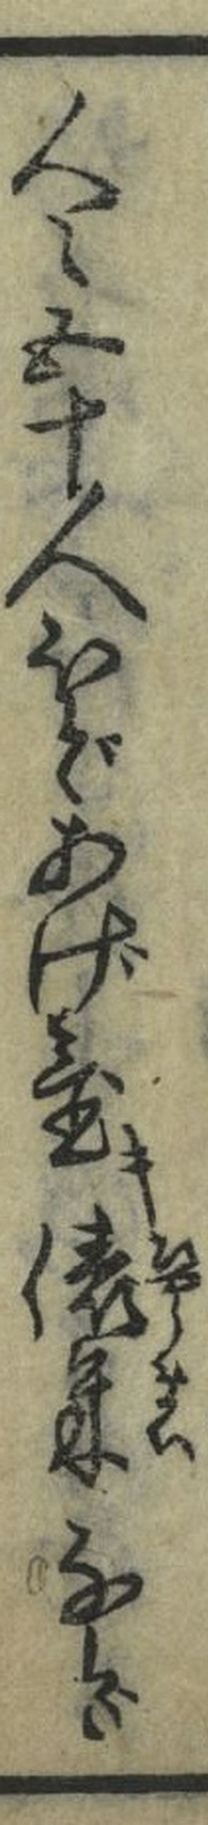人々五十人ほどあげ置き俵米など
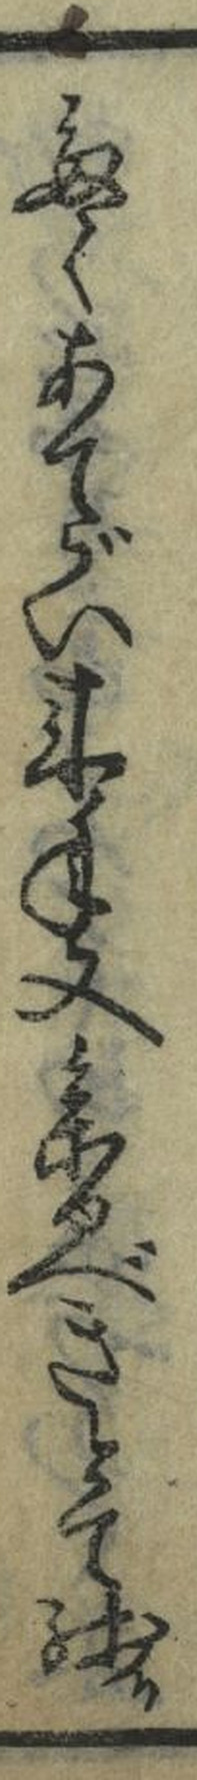多くあてがい来年又来るべきとて残り
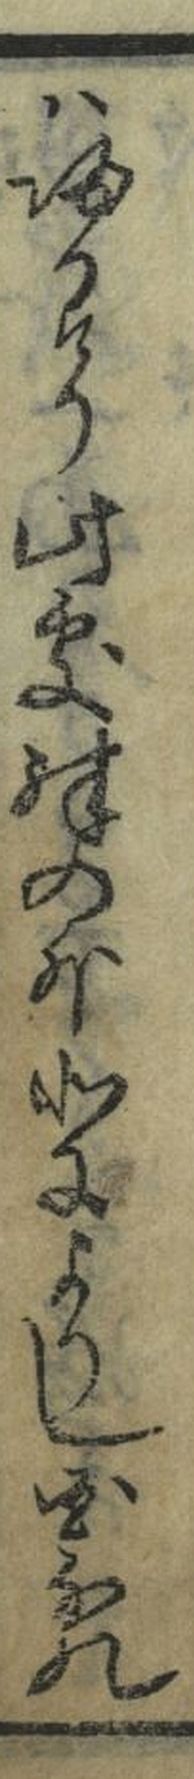は帰りけり此処殊の外北によりし国なれ
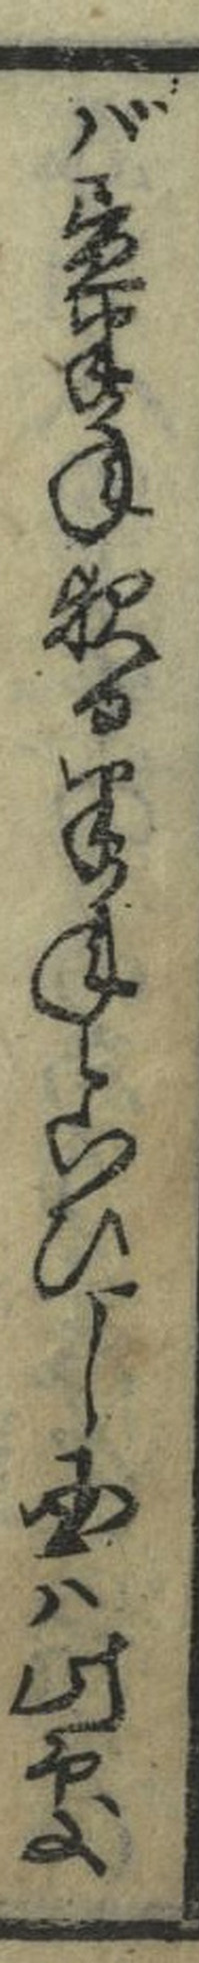ば昼半年夜半年といひし国は此処
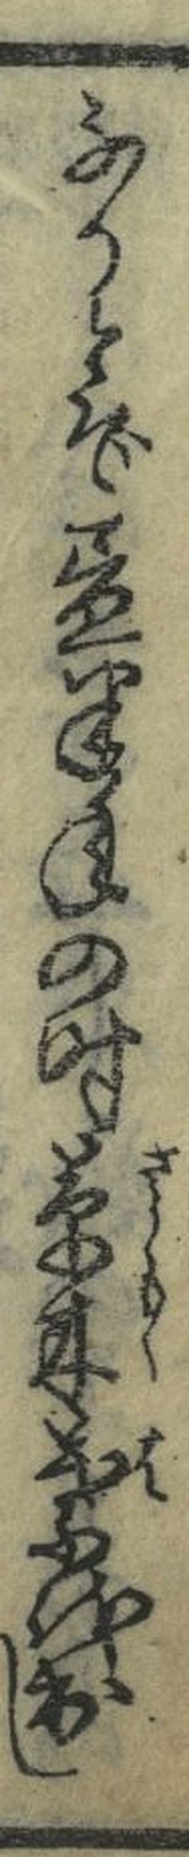なりとぞ昼半年の時草木葉を出し
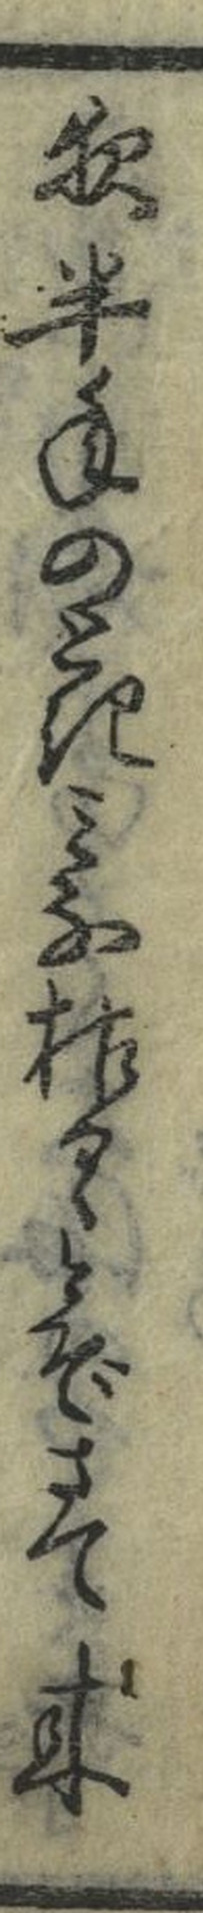夜半年のときみな枯るゝとぞさて来
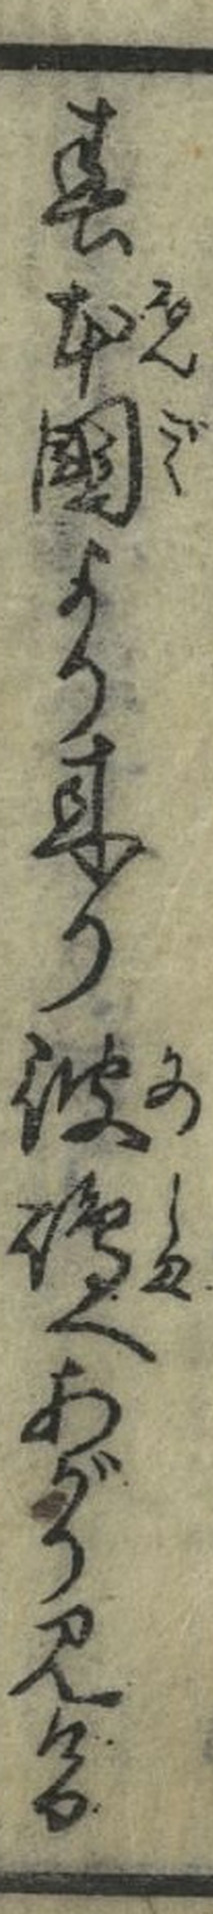春本国より来り彼島へあがり見ける
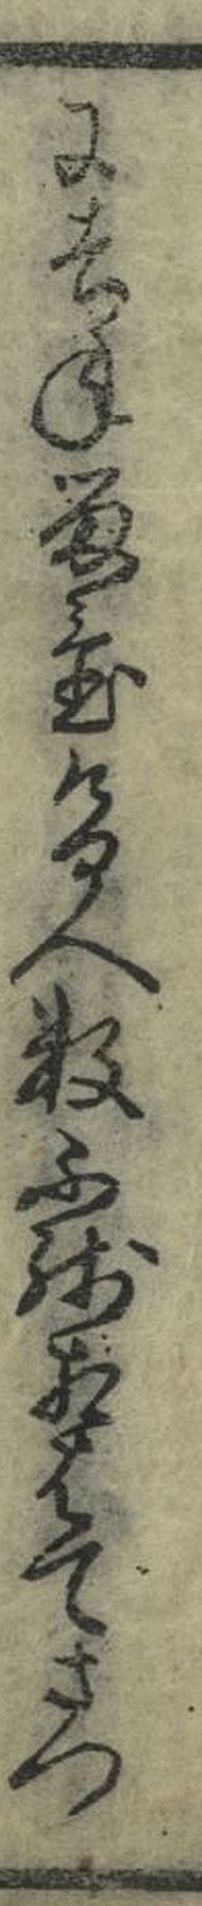に去年留置ける人数不残相はてさつ
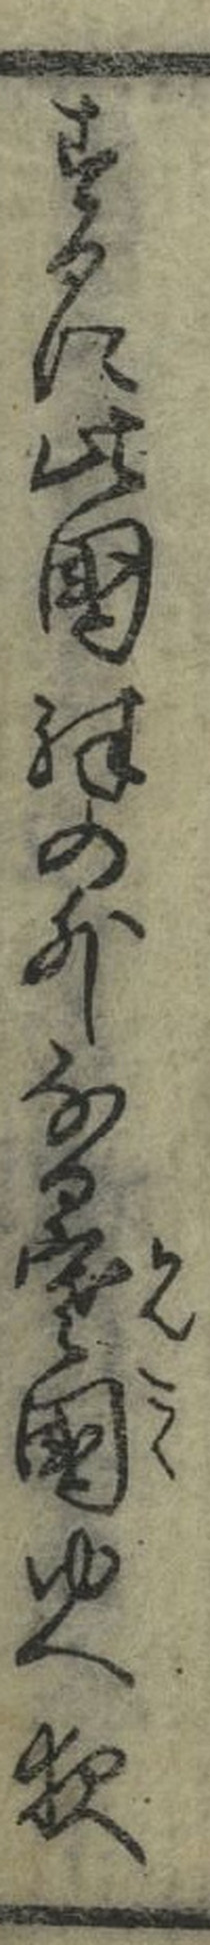するに此国殊の外なる寒国ゆへ夜

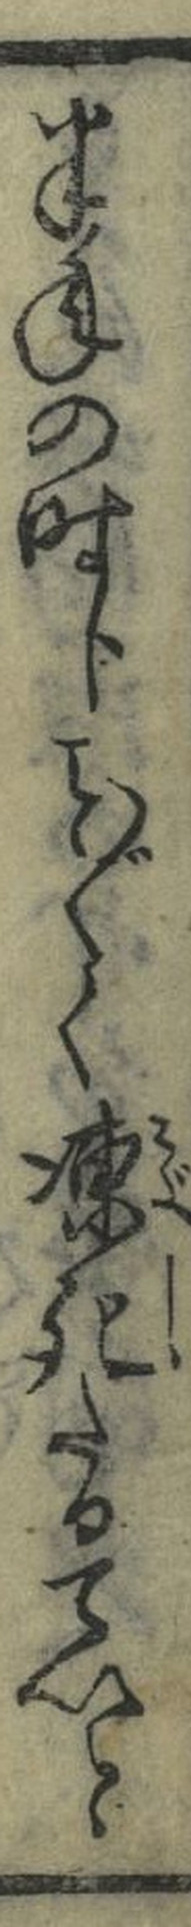半年の時じこと〴〵く凍死たるていと
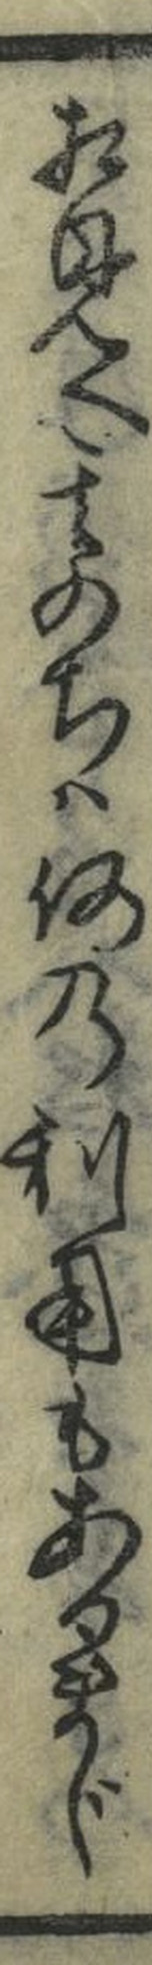相見へ其のちは何の利用もあるまじ
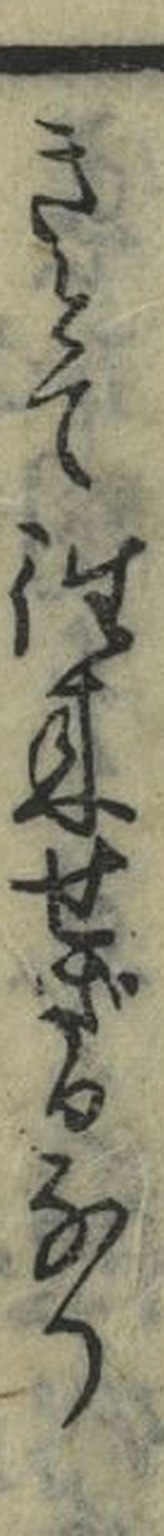きとて往来せざるなり
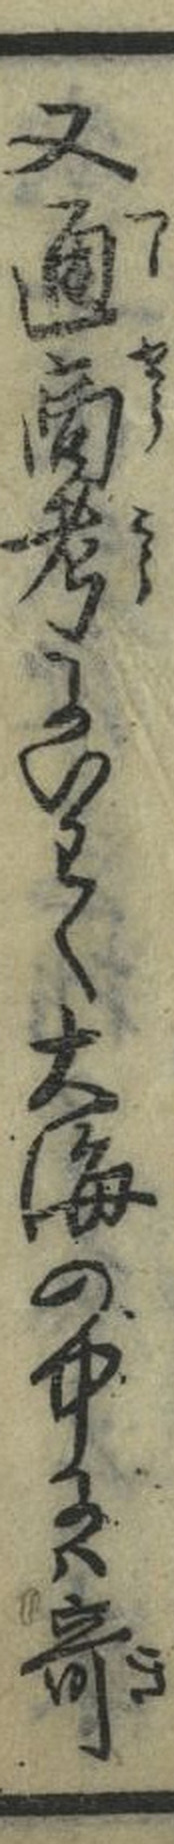又通商考にいわく大海の中には奇
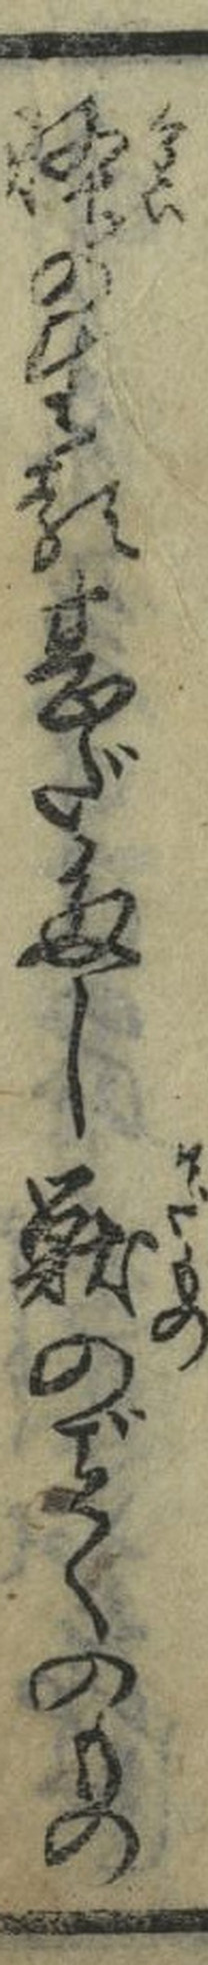怪の生類甚だ多し獣のごとくのもの
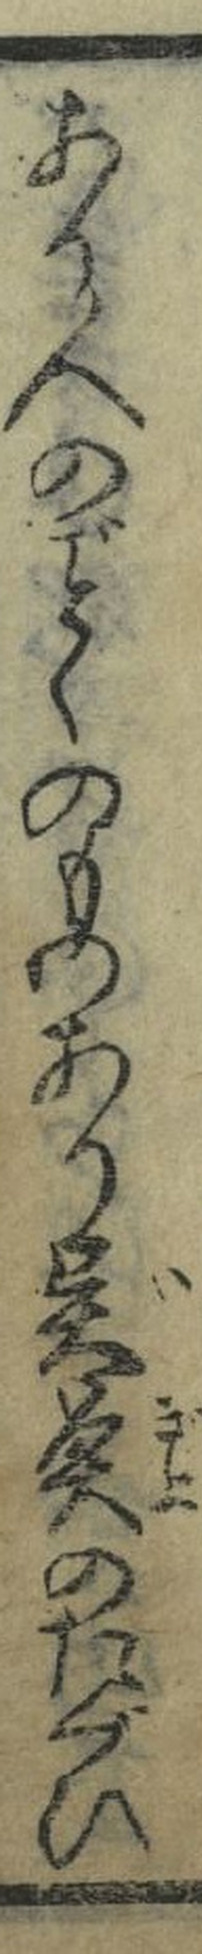あり人のごとくのものあり異魚のたぐひ
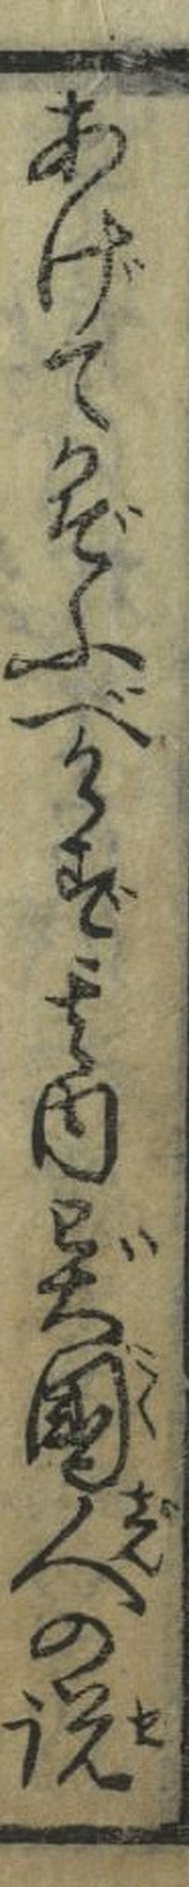あげてかぞふべからず其内異国人の説
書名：琉球雑話
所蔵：University of the Ryukyus Library
